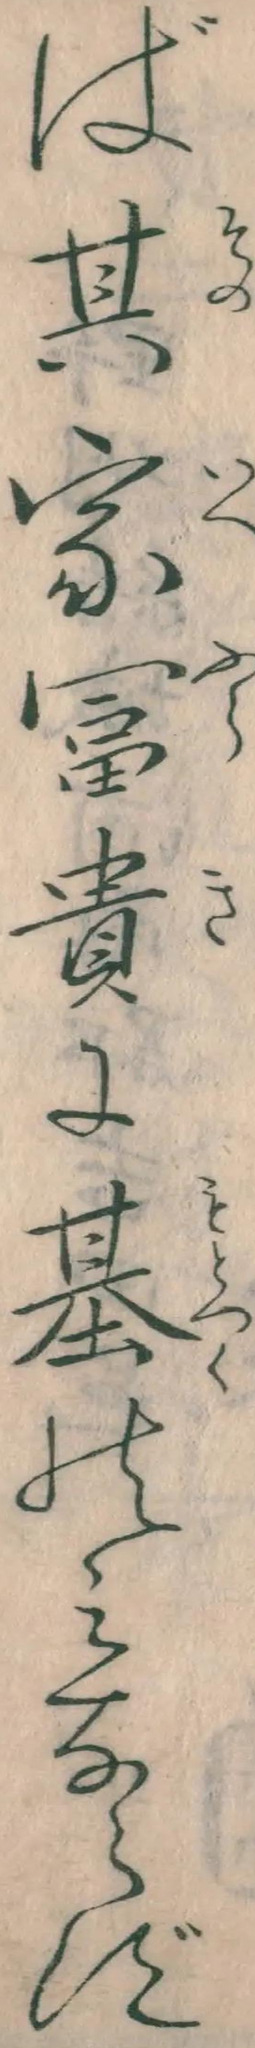ば其家富貴に基のみならず
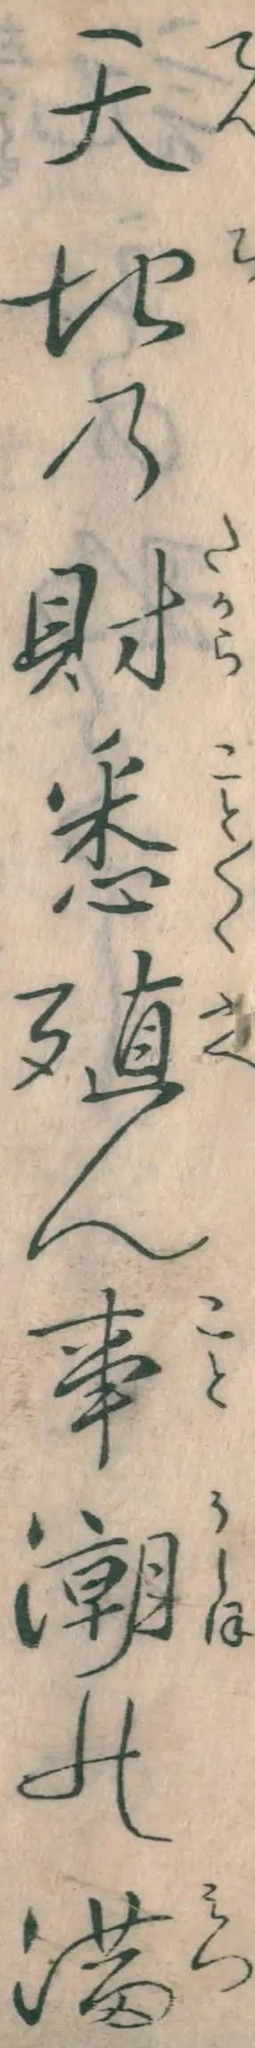天地の財悉殖ん事潮の満
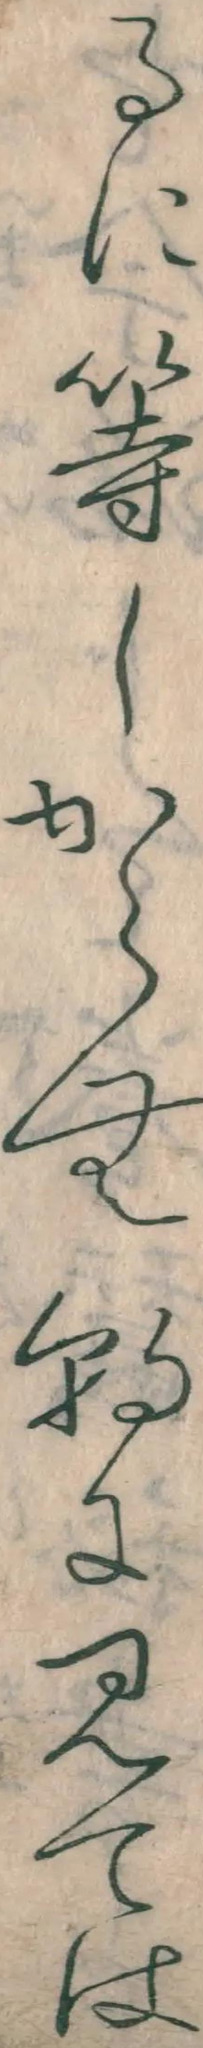るに等しからむ朝に見ては
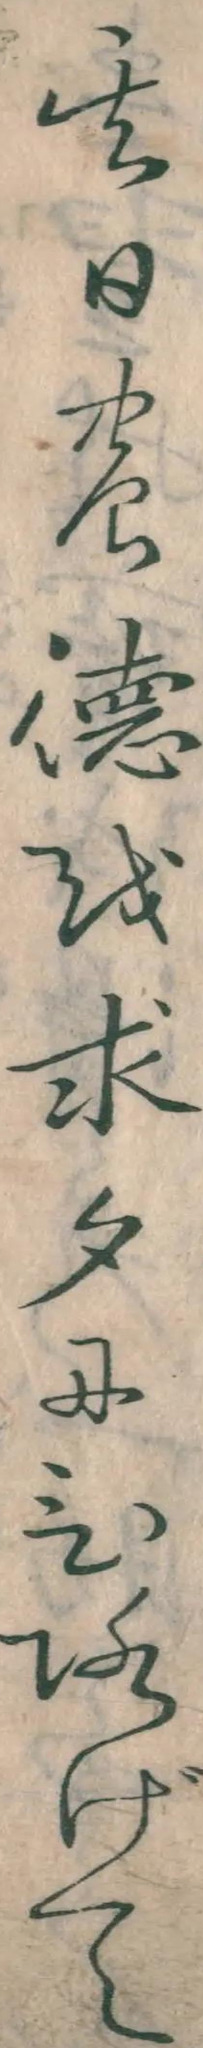其日の徳を求夕にひろげて

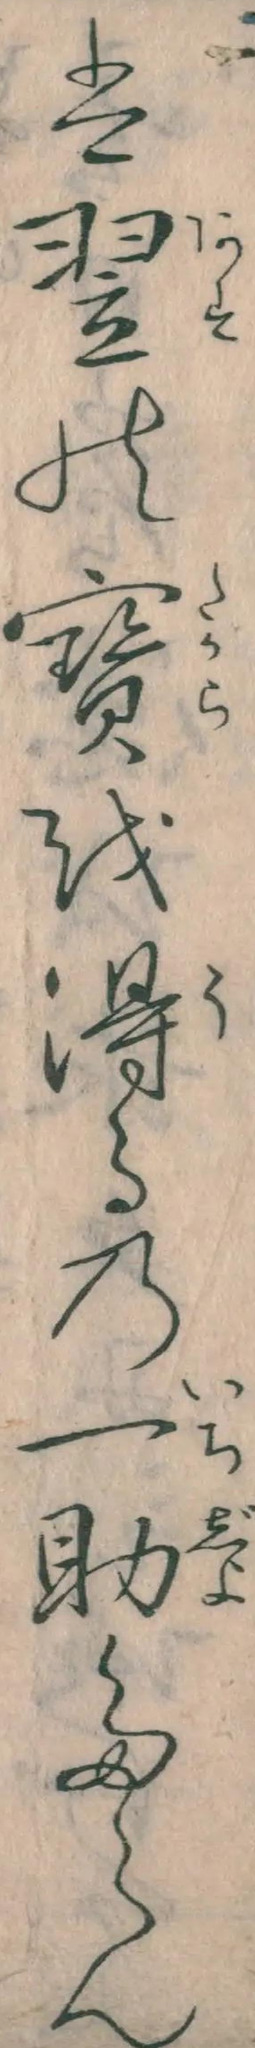は翌の宝を得るの一助たらん
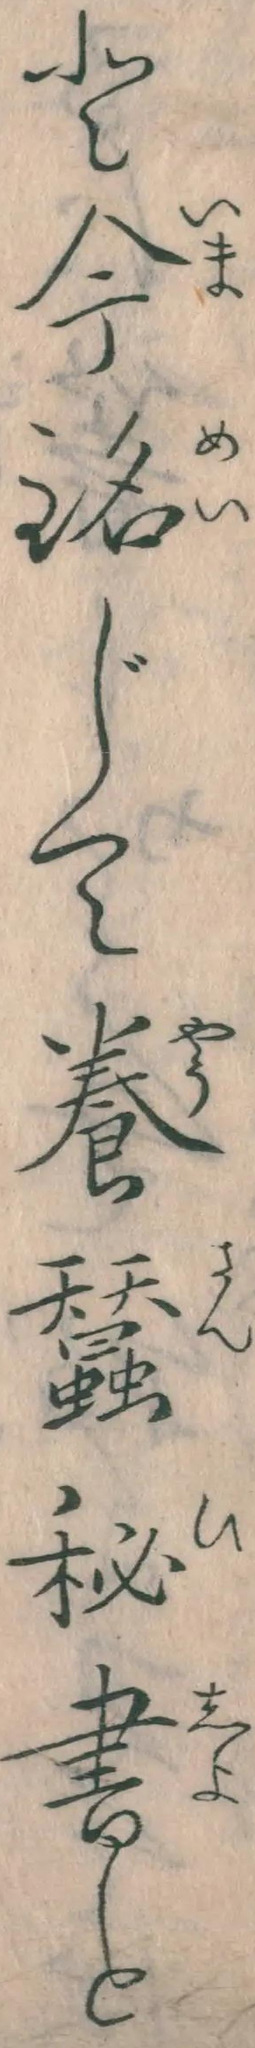と今銘じて養蚕秘書と
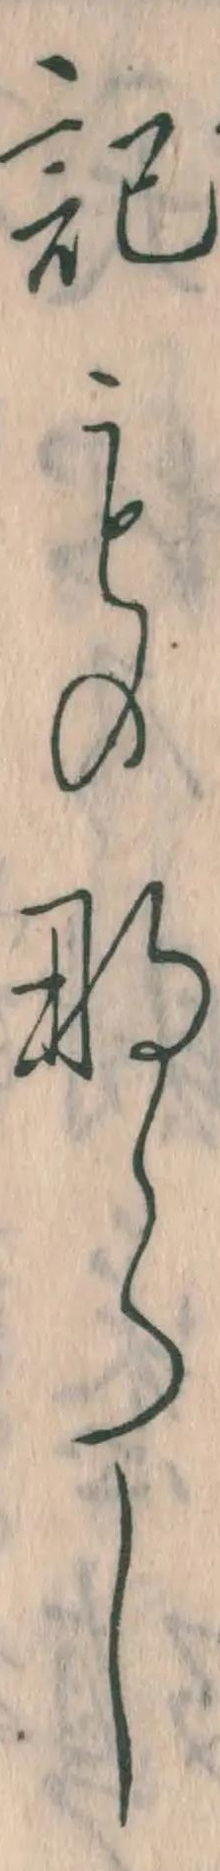記ものならし
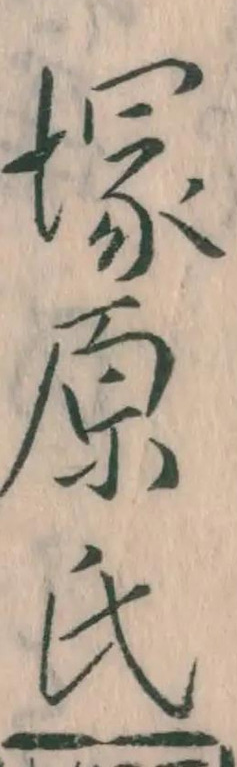塚原氏
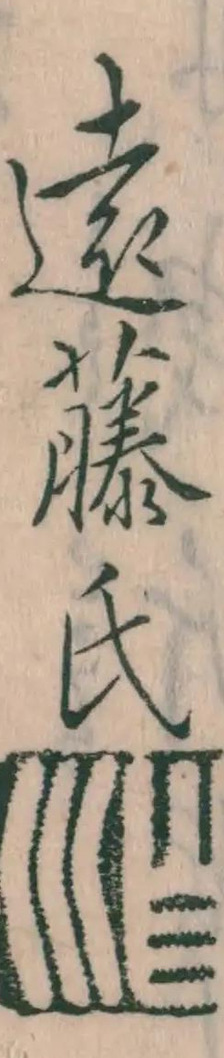遠藤氏
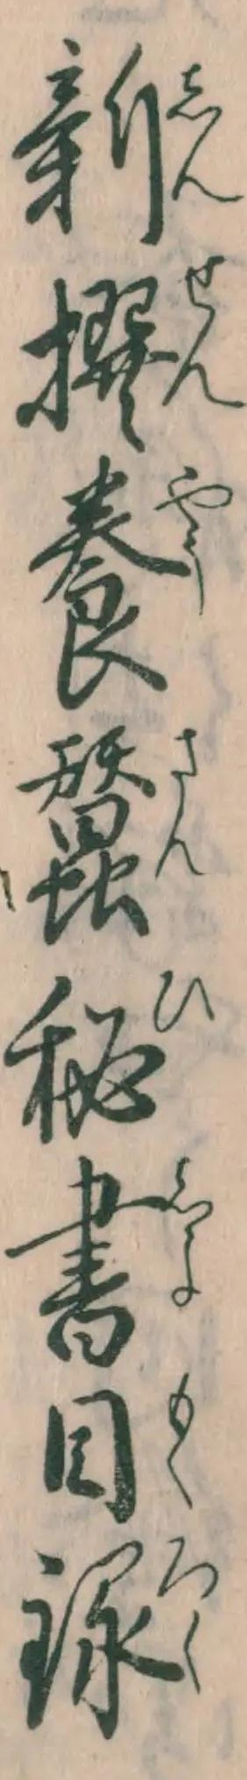新撰養蚕秘書目録
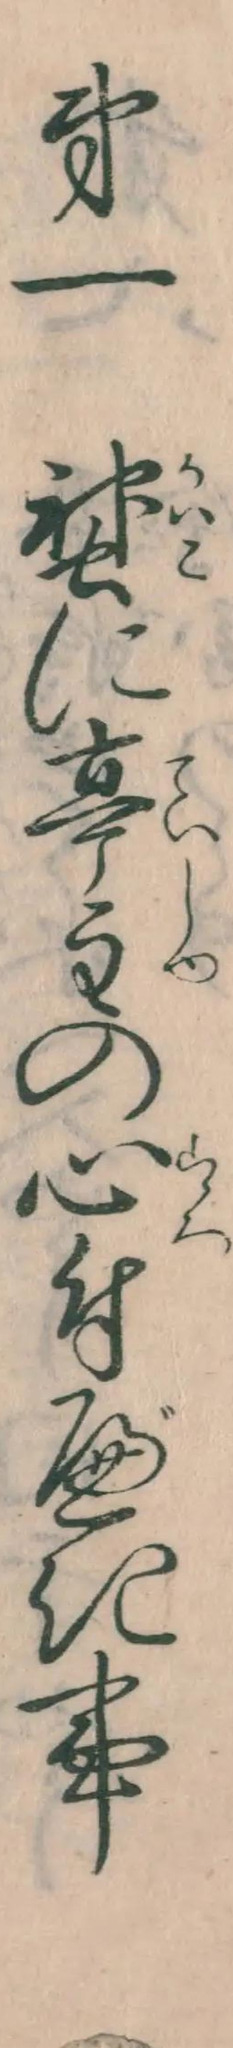第一䗝に亭主の心付べき事
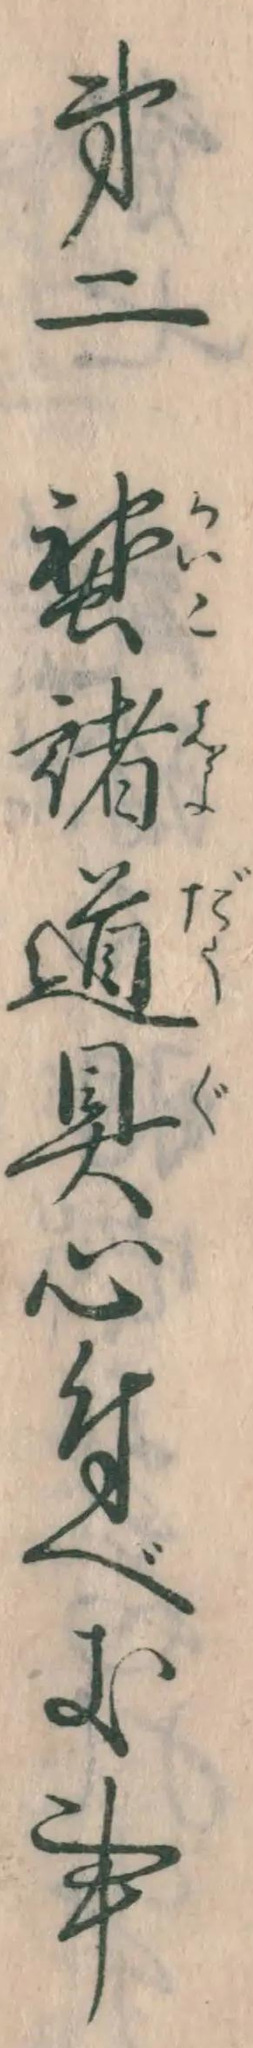第二䗝諸道具心付べき事
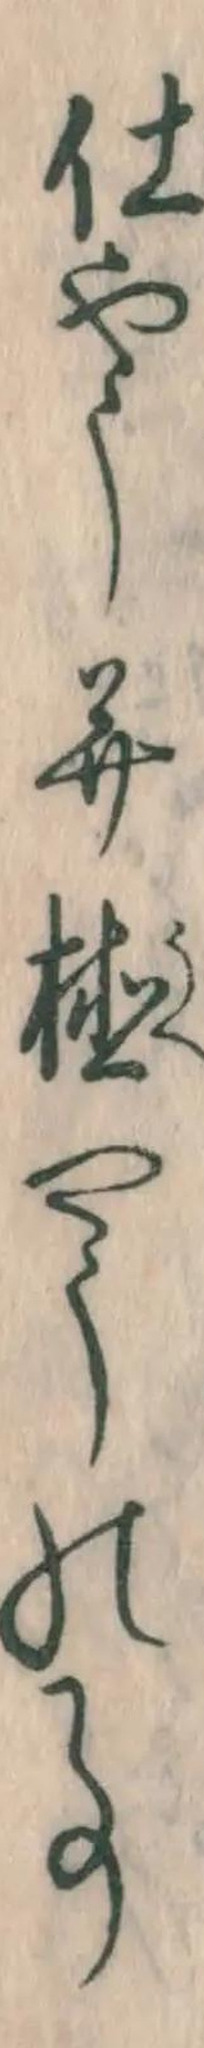仕やう并植やうの事
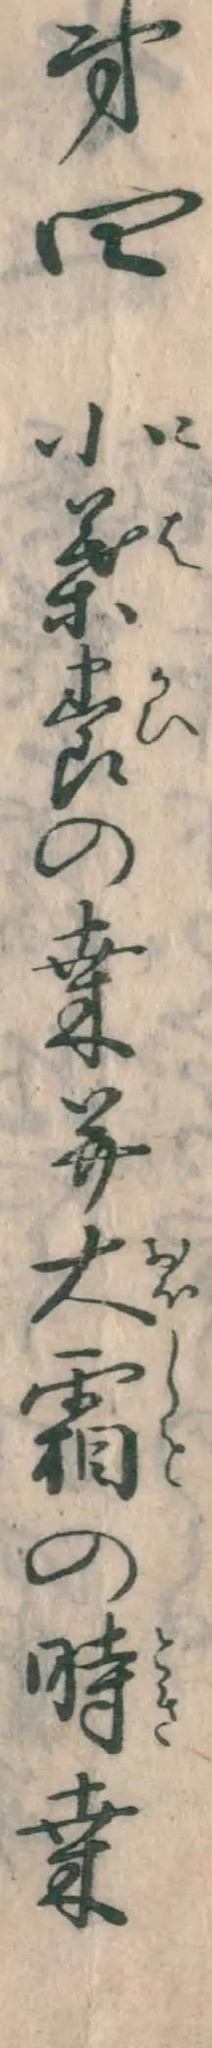第四小葉養の桑并大霜の時桑
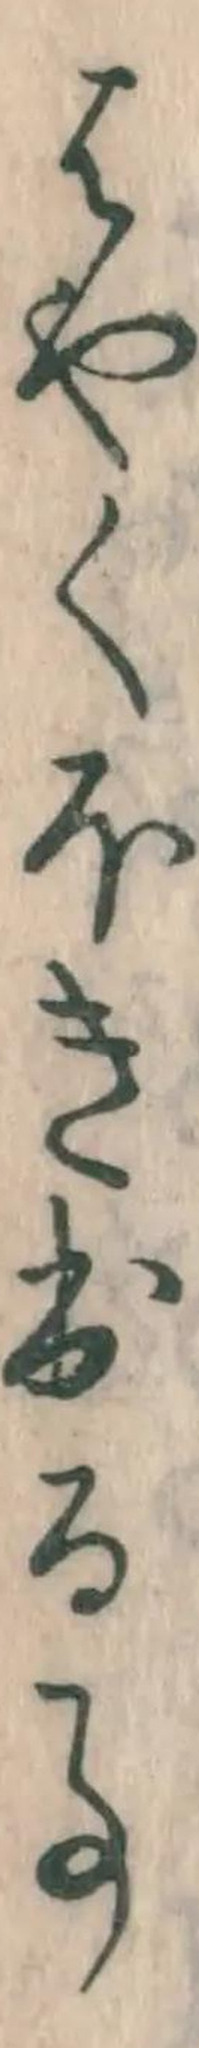はやくほき出る事

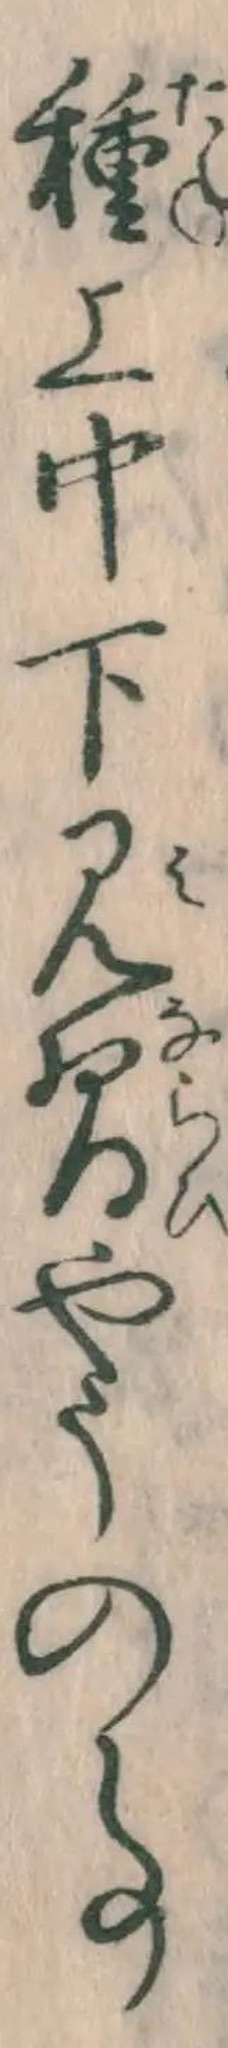種上中下見習やうの事
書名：新撰養蚕秘書
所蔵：国立国会図書館 National Diet Library, JAPAN
